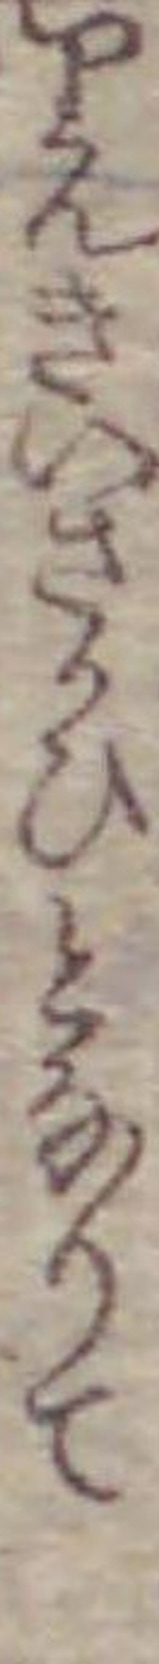りんきいさかひとなりて
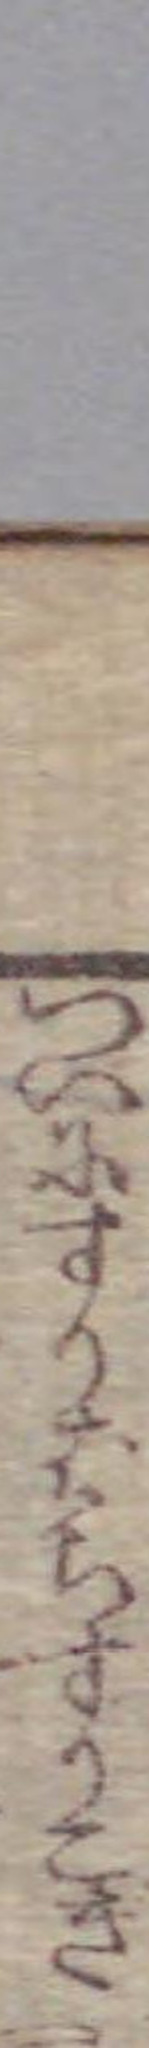ついにすりばちすりこぎ
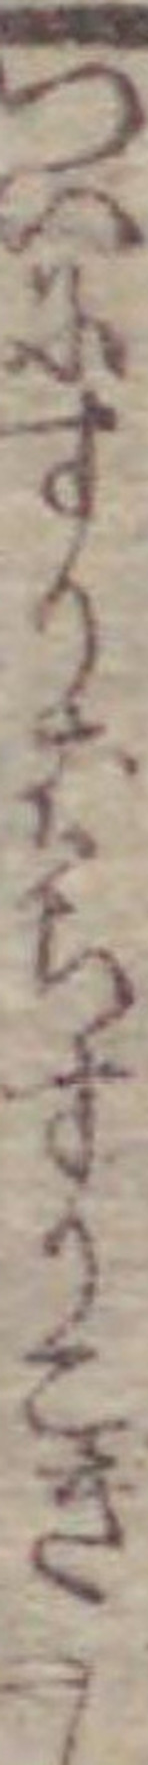ついにすりばちすりこぎ

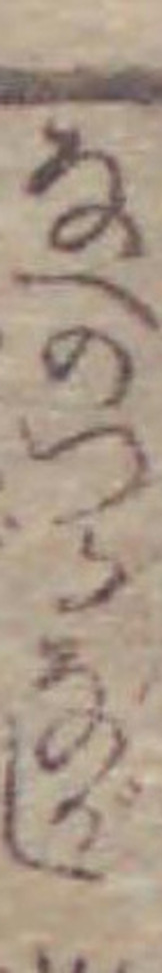なへのつるながし
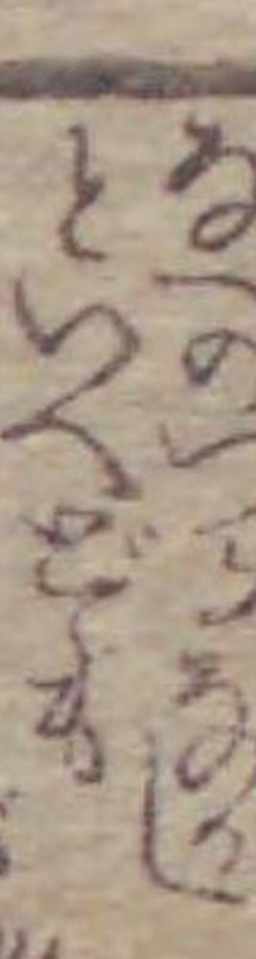といへども
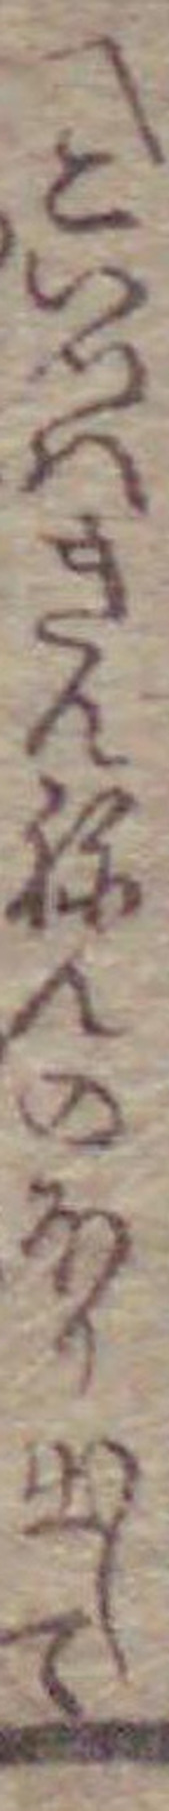〽こいつはきんねんのほり出して
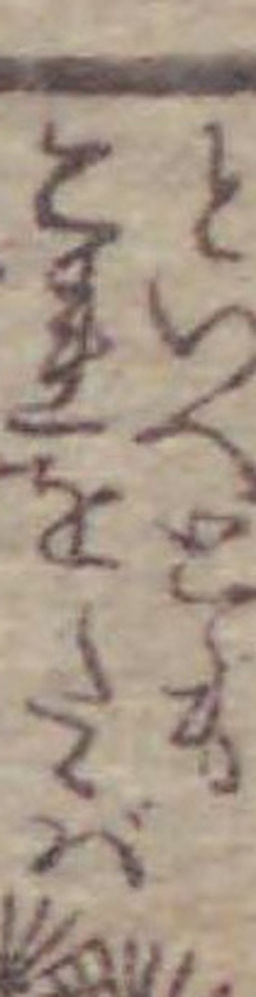これをたゝば
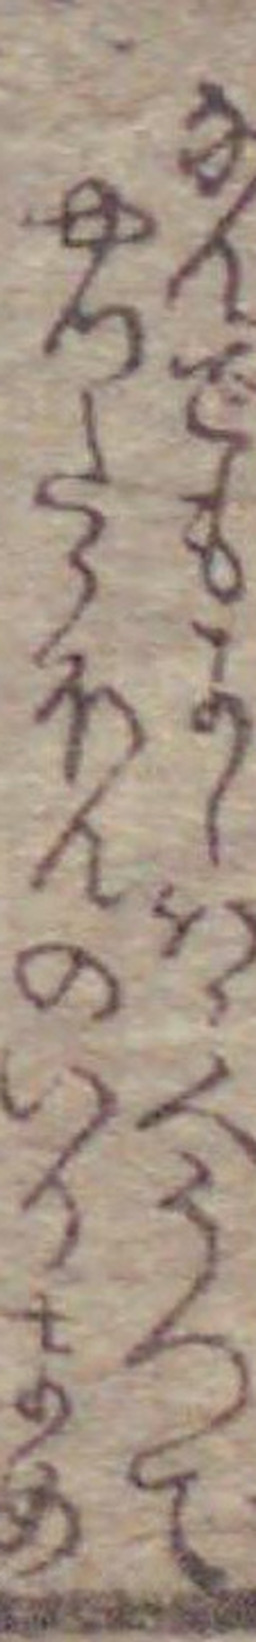やつたらほんのいりまめに
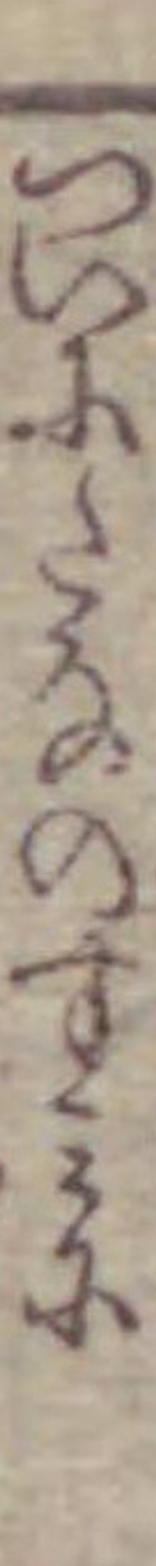ついにたなのすみに
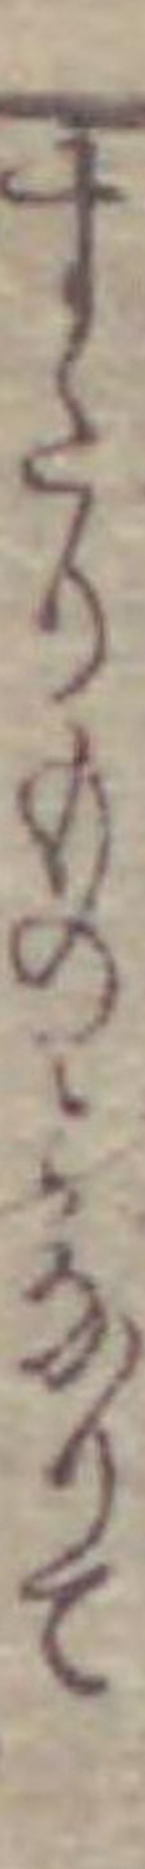すたりものとなりて
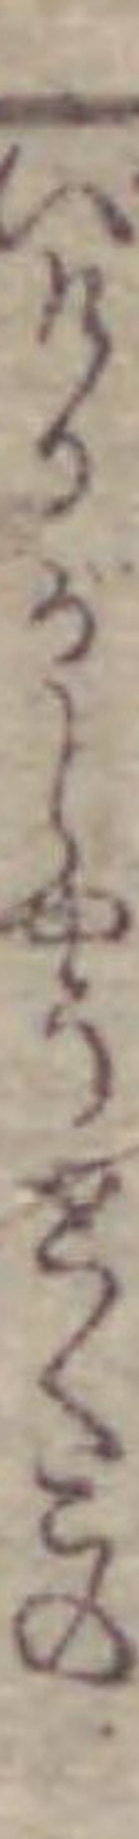いけるがしやうとくこの
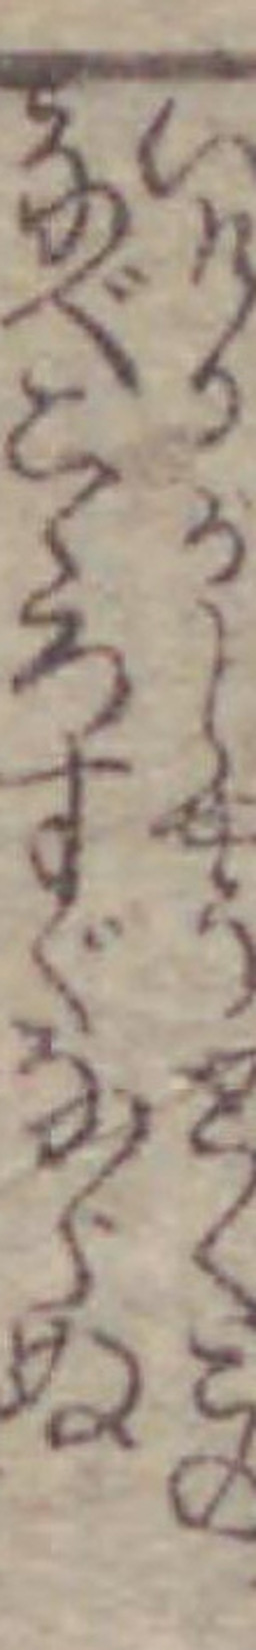なべこゝろすぐならぬ
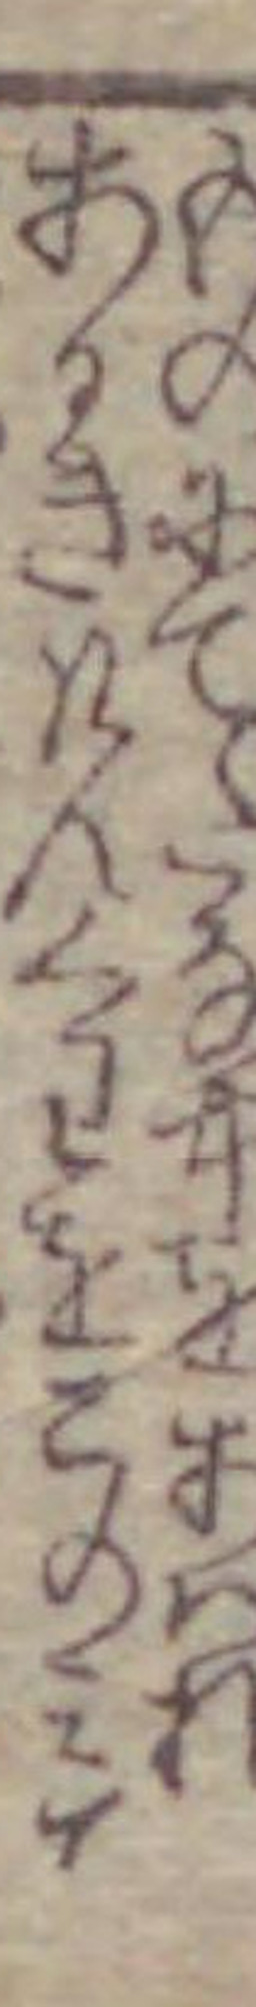あるきけんくわをこのみて
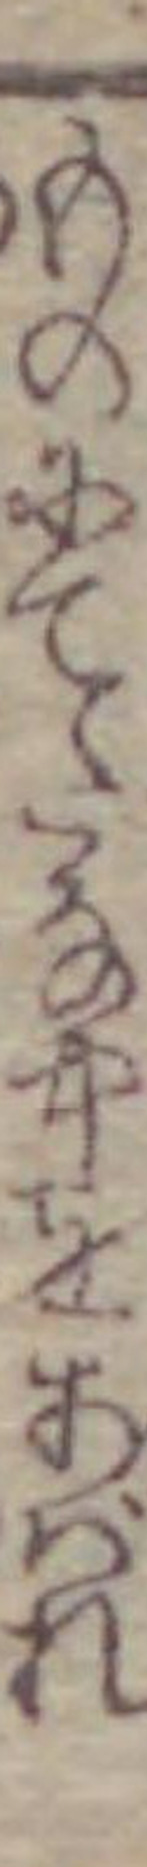ものにてたな中をあばれ
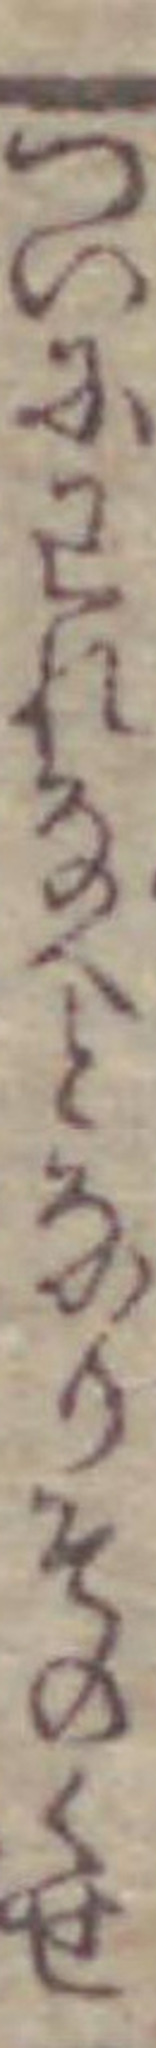ついにわれなへとなりそのくせ
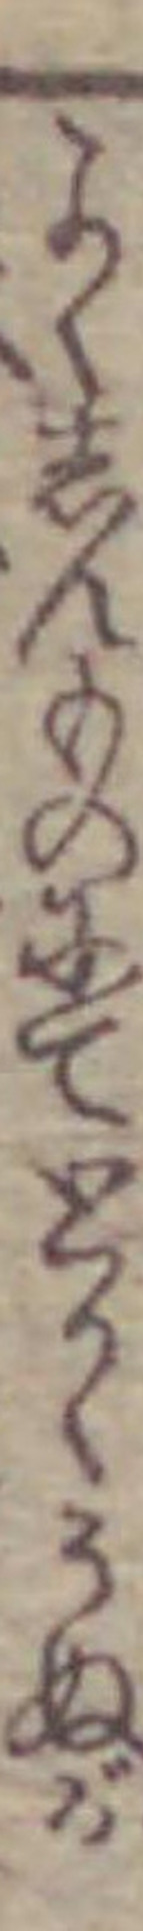よくしんものにてとかくうぬが
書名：万物小遣帳 : 2巻
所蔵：国立国会図書館 National Diet Library, JAPAN
